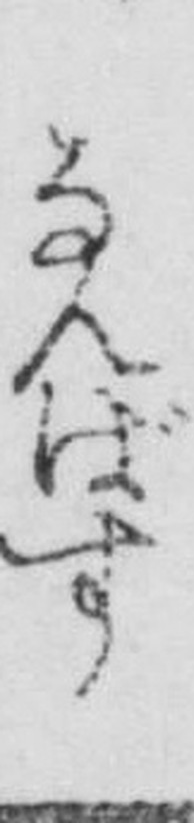なんばず
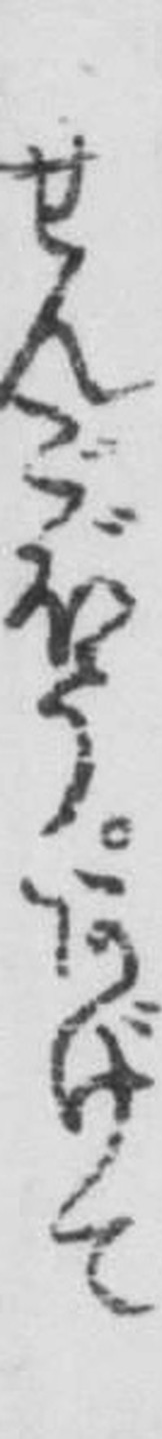せんごぼうあげて
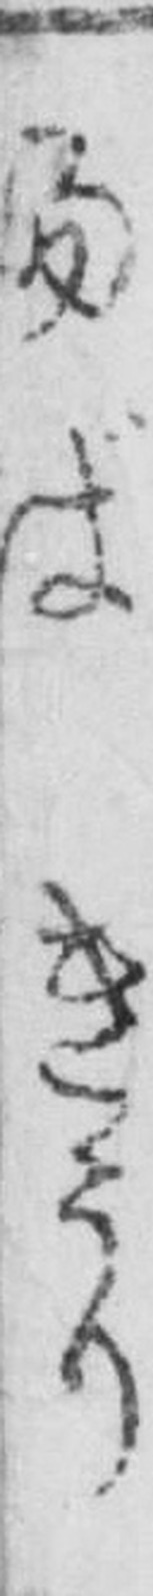ゆばきうり
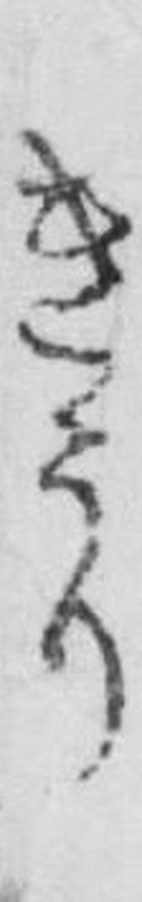きうり
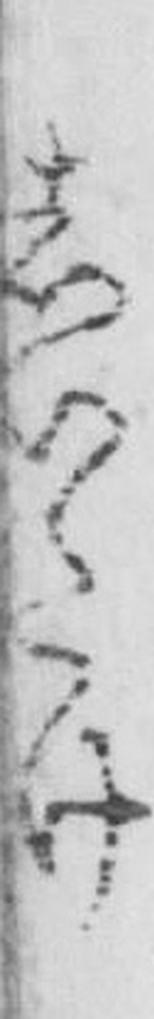しいたけ

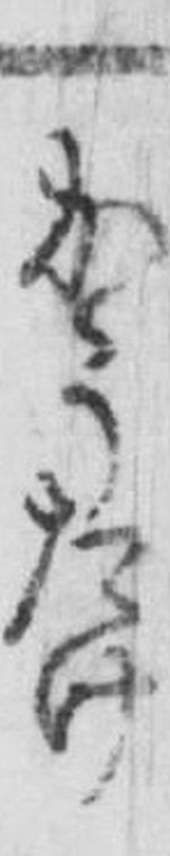かうたけ
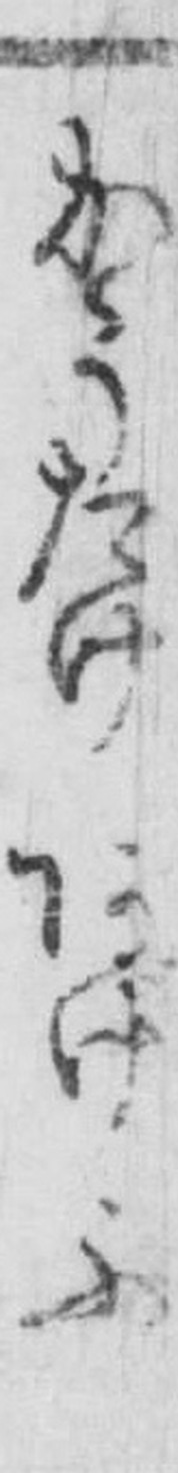かうたけあげふ
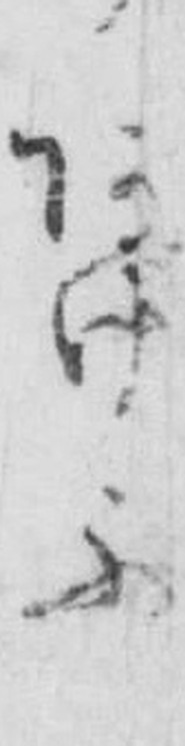あけふ
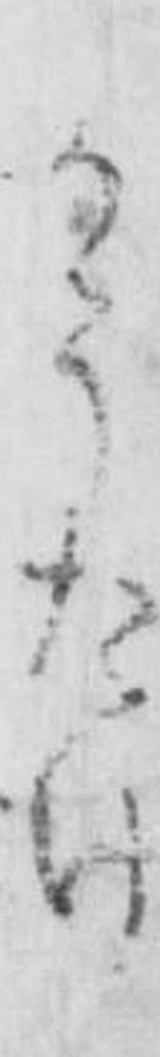かうたけ
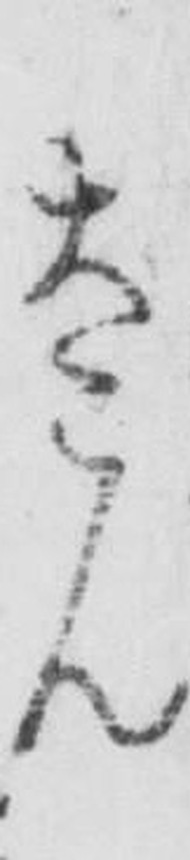大こん
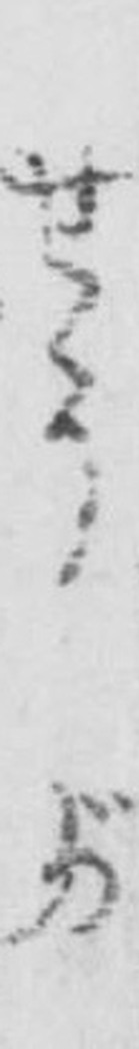せうが
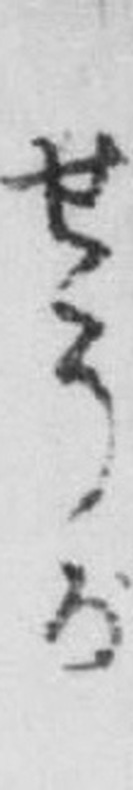せうが
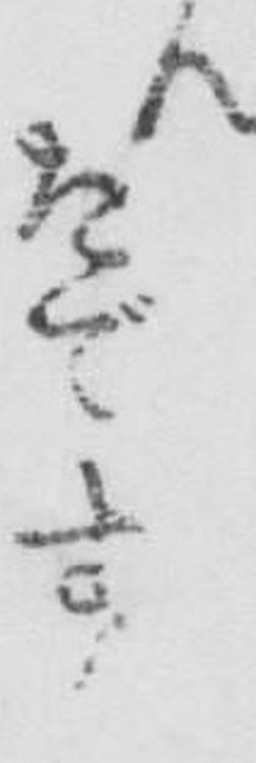たです
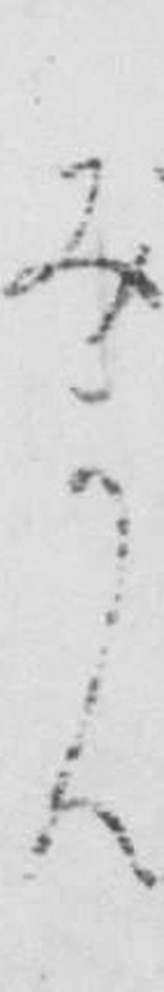みかん
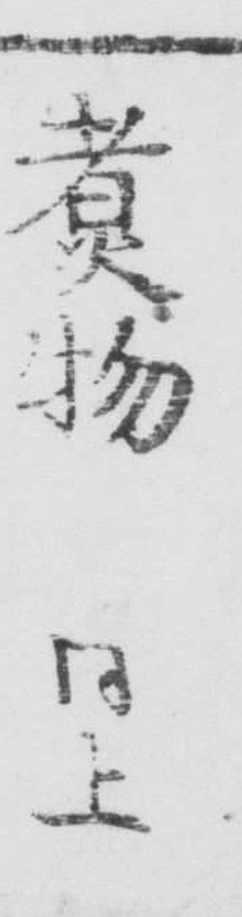煮物同上
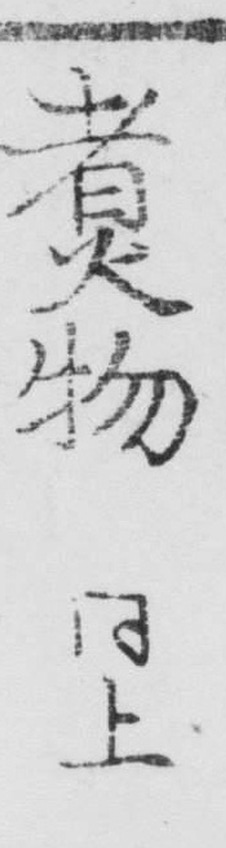煮物同上
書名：諸家通用/即席料理
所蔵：大阪府立大学学術情報センター 国文学研究資料館
